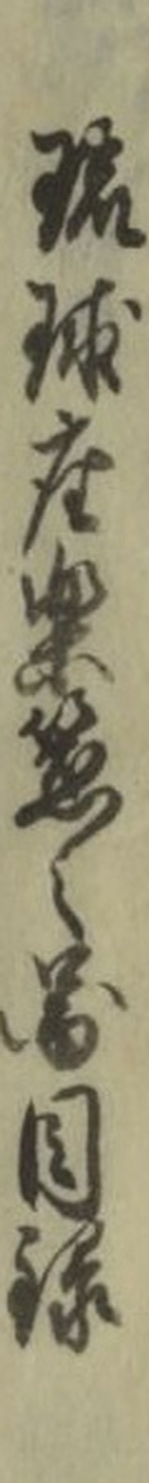琉球座楽之図目録
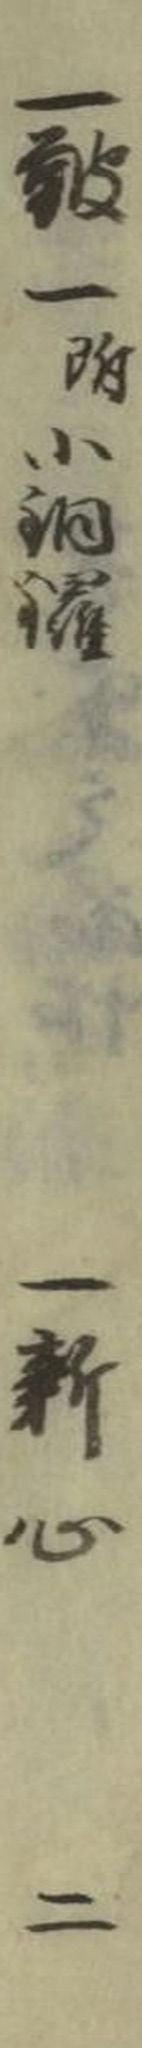一鞭一附小銅鑼一新心二
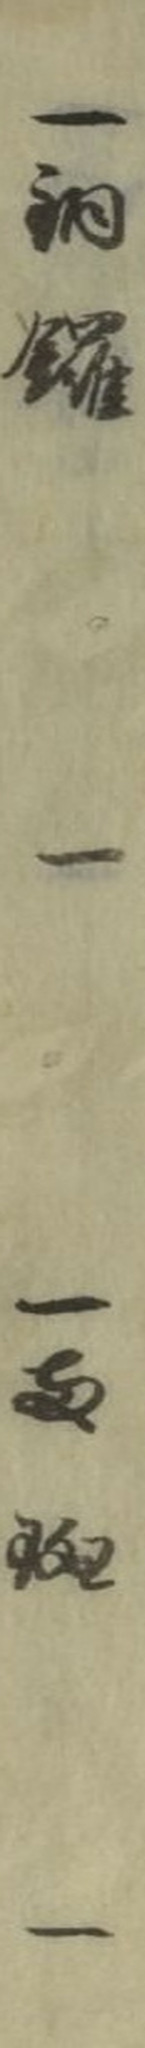一銅鑼一一両班一
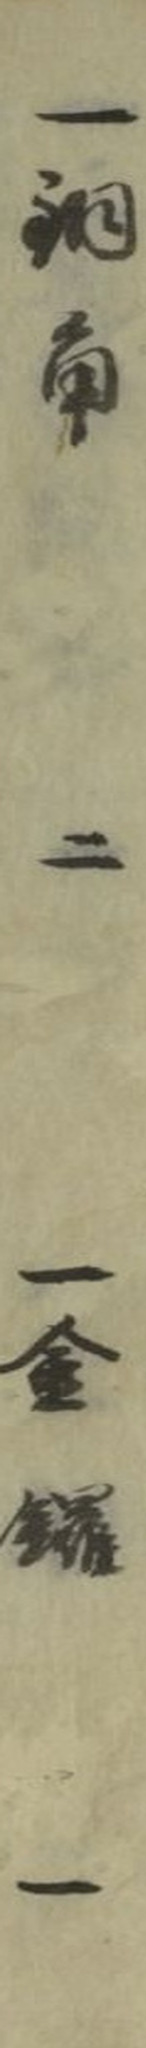一銅角二一金鑼一
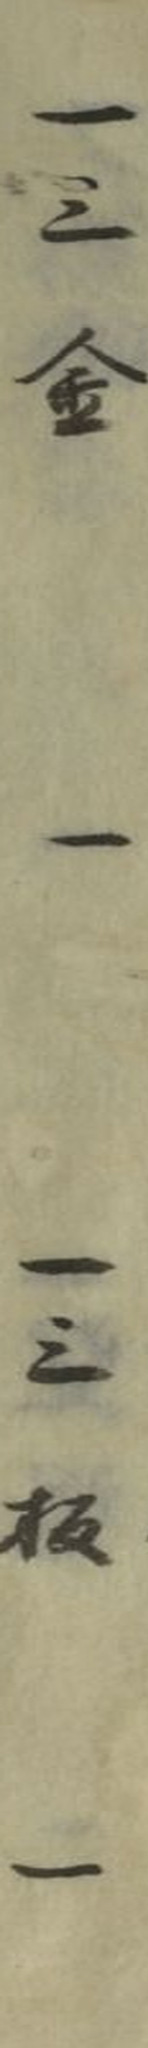一三金一一三板一

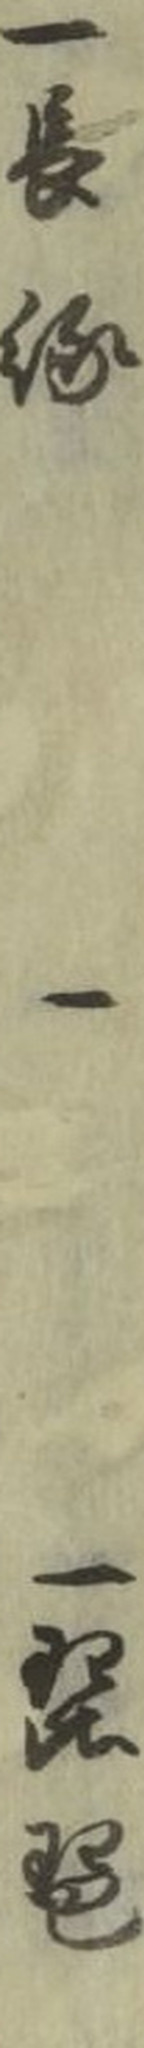一長線一一琵琶
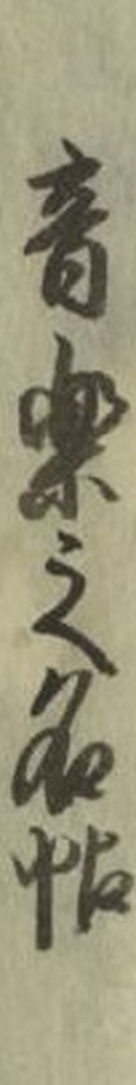音楽之名帳
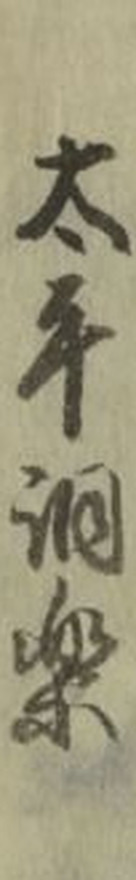太平調楽
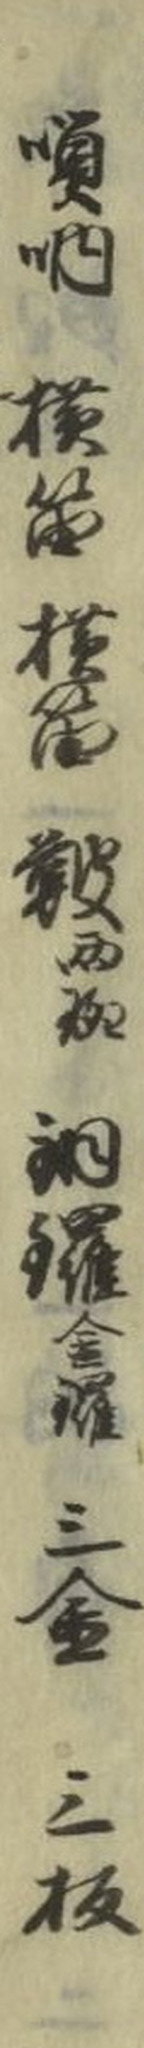嗩吶横笛横笛鞭小銅鑼銅鑼三金三板
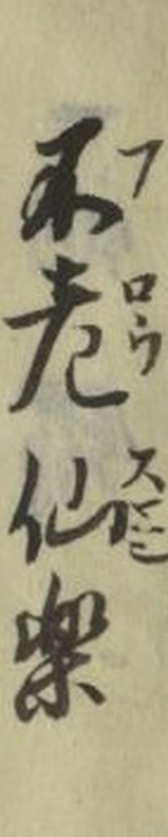不老賤楽
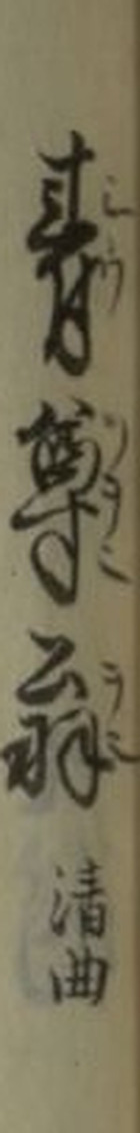青尊翁清曲
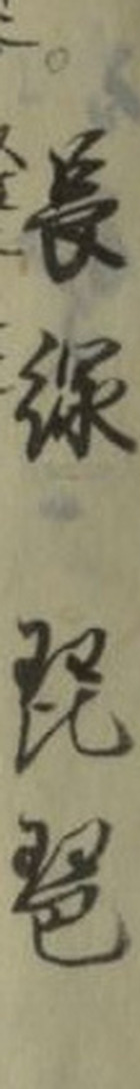長線琵琶
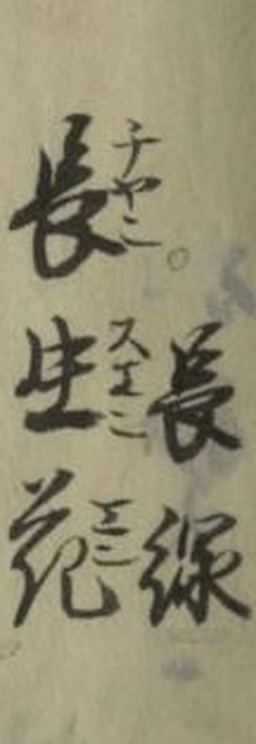長生花
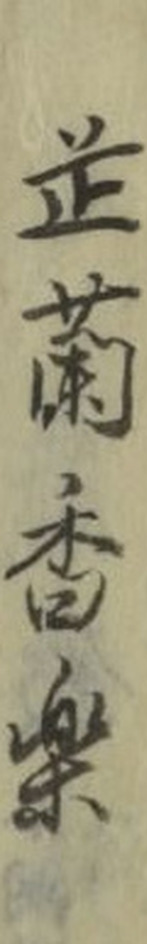芝蘭香楽
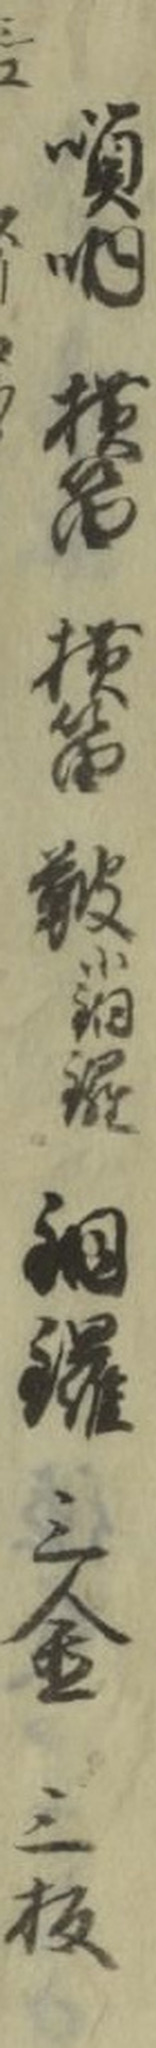嗩吶横笛横笛鞭小銅鑼銅鑼三金三板
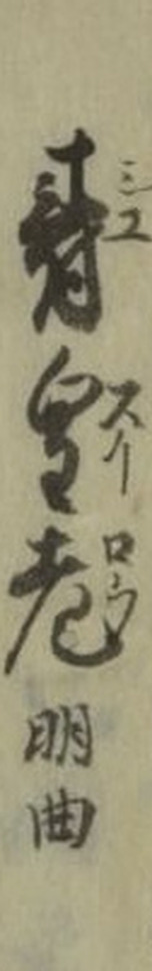青皇老明曲
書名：琉球人来朝之記
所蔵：University of the Ryukyus Library
